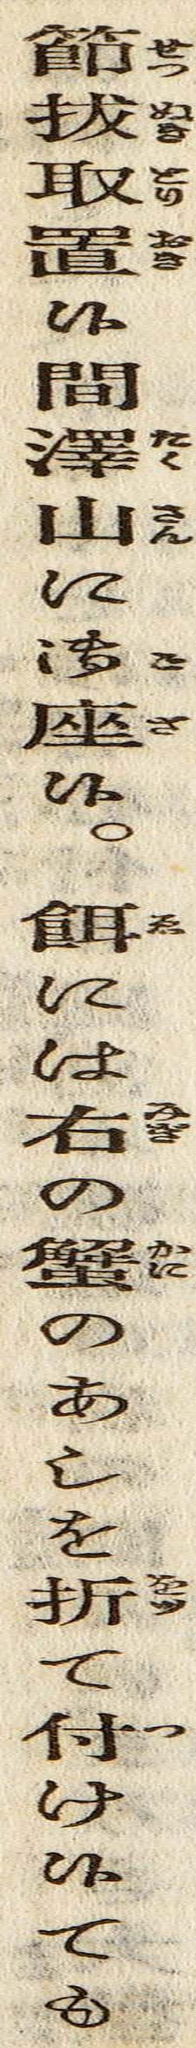節抜取置候間沢山に御座候。餌には右の蟹のあしを折て付け候ても
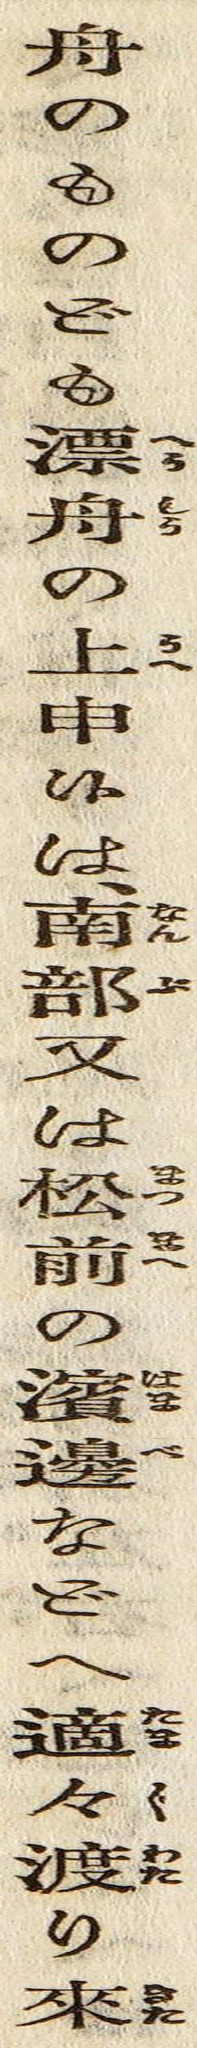舟のものども漂舟の上申候は、南部又は松前の浜辺などへ適々渡り来
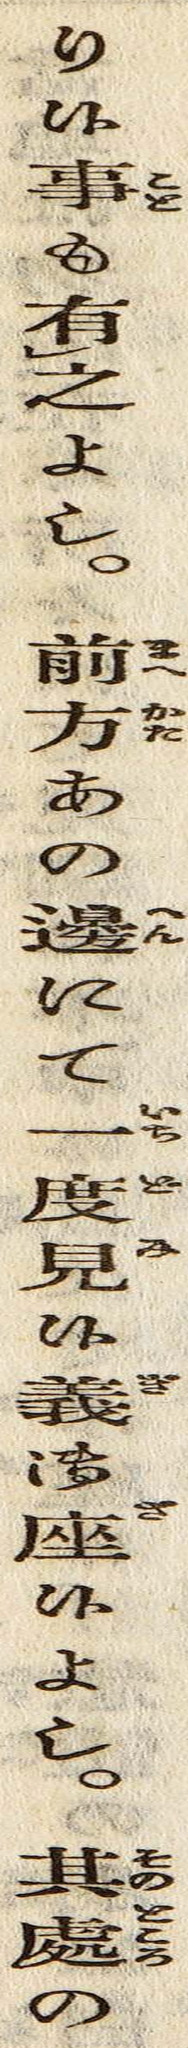り候事も有之よし。前方あの辺にて一度見候義御座候よし。其処の
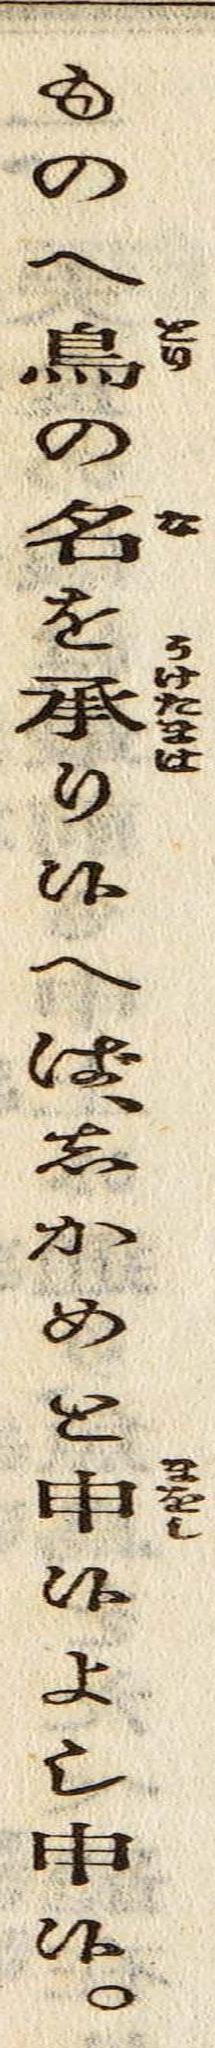ものへ鳥の名を承り候へば、しかめと申候よし申候。
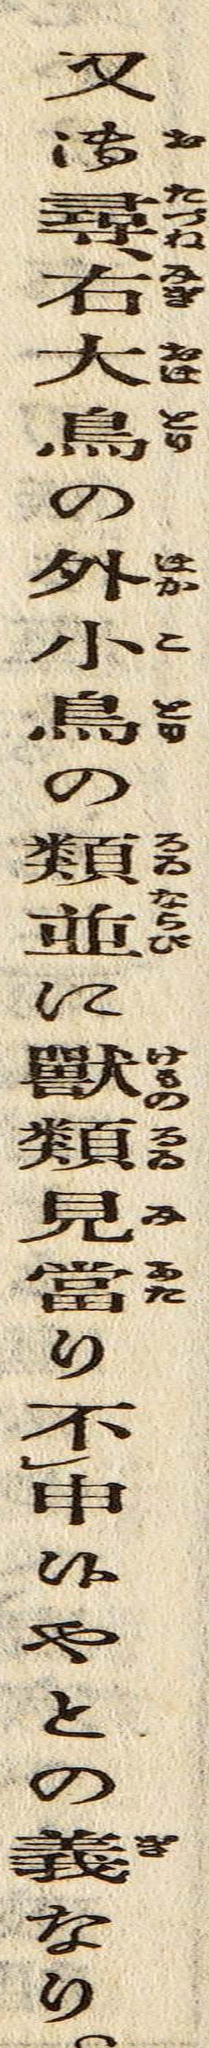又御尋、右大鳥の外小鳥の類並に獣類見当り不申候やとの義なり。
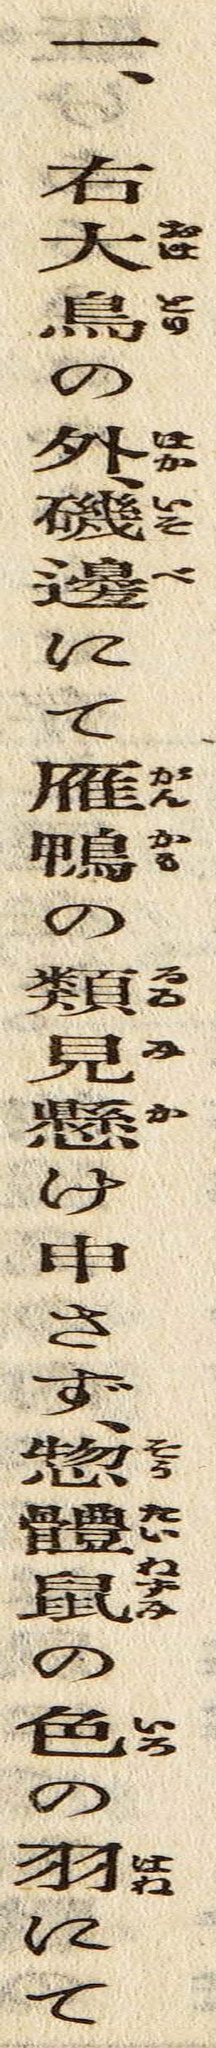一、右大鳥の外、磯辺にて雁鴨の類見懸け申さず、総体鼠の色の羽にて
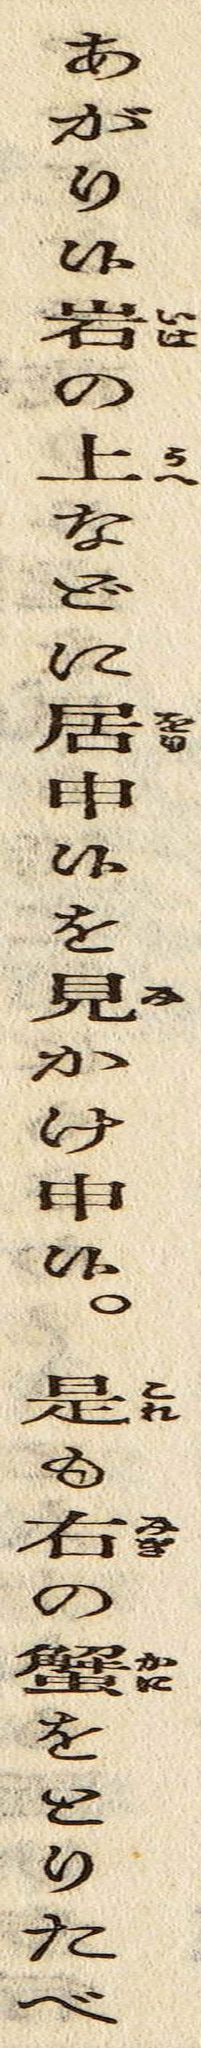あがり候岩の上などに居申候を見かけ申候。是も右の蟹をとりたべ
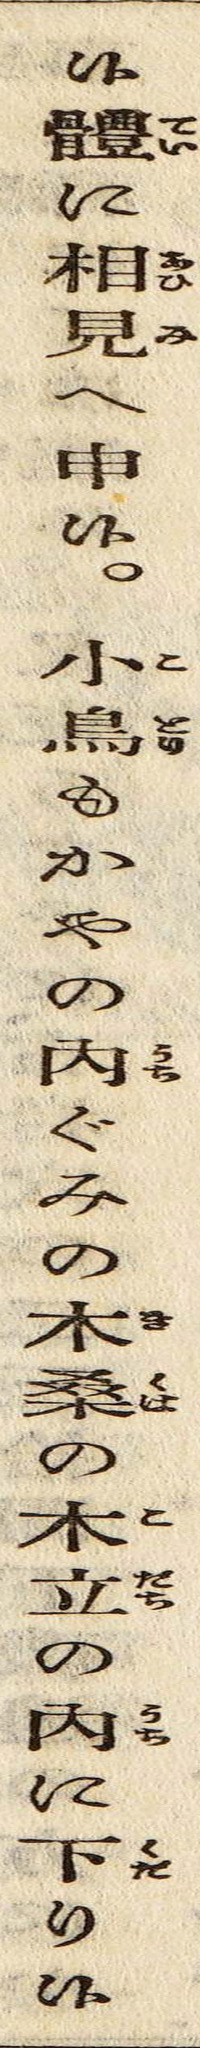候体に相見へ申候。小鳥もかやの内ぐみの木桑の木立の内に下り候
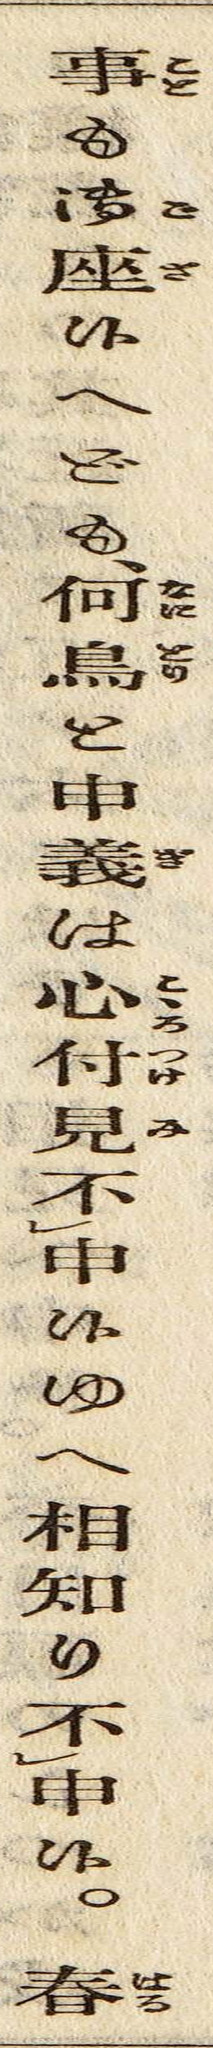事も御座候へども、何鳥と申義は心付見不申候ゆへ相知り不申候。春
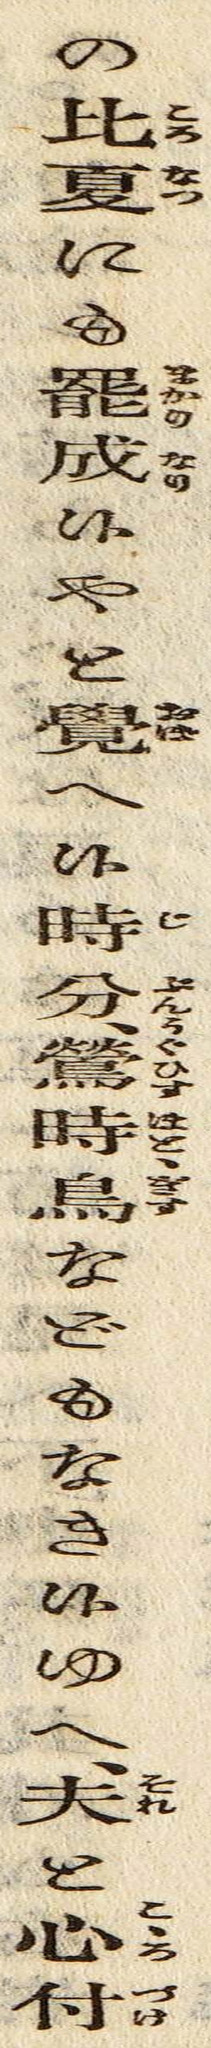の比夏にも罷成候やと覚へ候時分、鶯時鳥などもなき候ゆへ、夫と心付
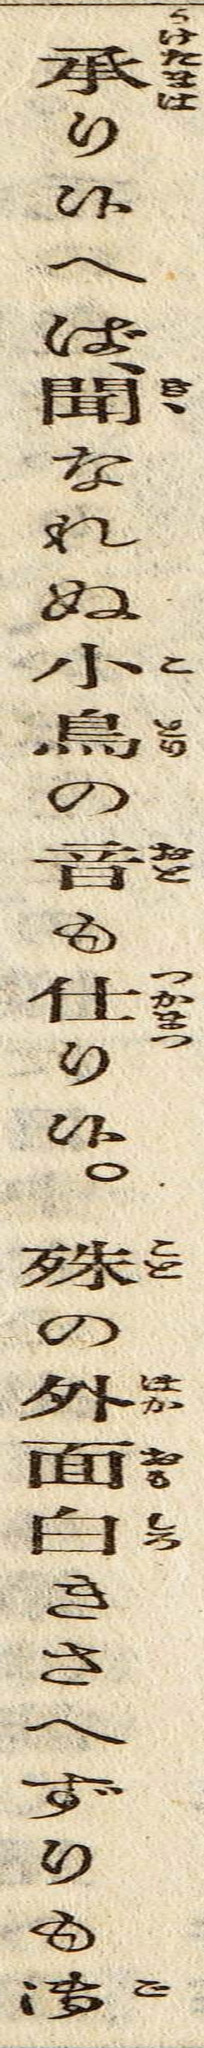承り候へば、聞なれぬ小鳥の音も仕り候。殊の外面白きさへずりも御
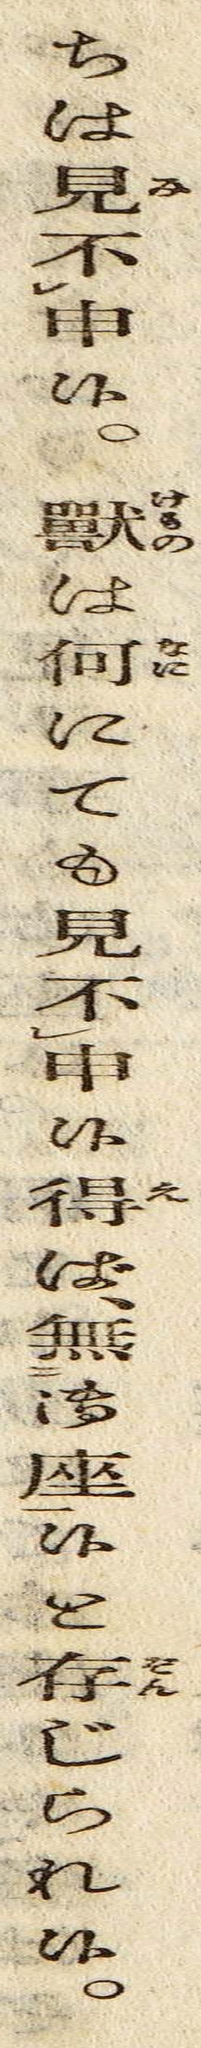ちは見不申候。獣は何にても見不申候得ば、無御座候と存じられ候。
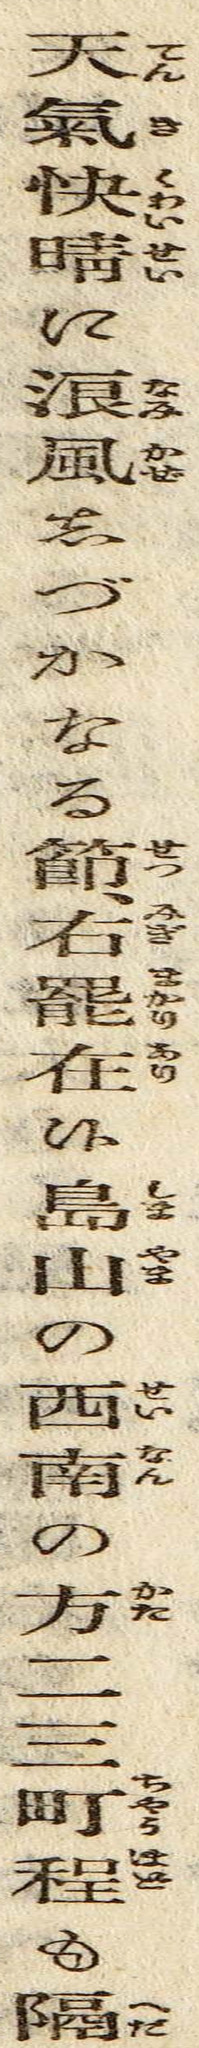天気快晴に浪風しづかなる節、右罷在候島山の西南の方二三町程も隔
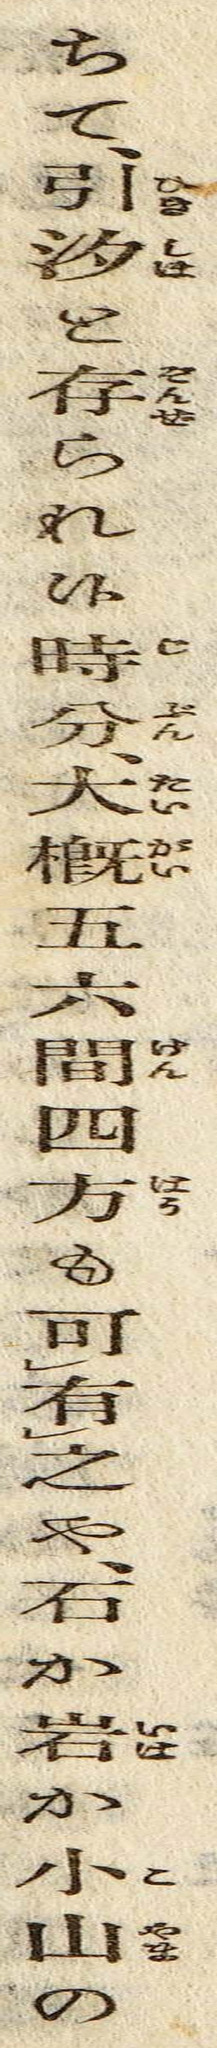ちて、引汐と存られ候時分、大概五六間四方も可有之や、石か岩か小山の

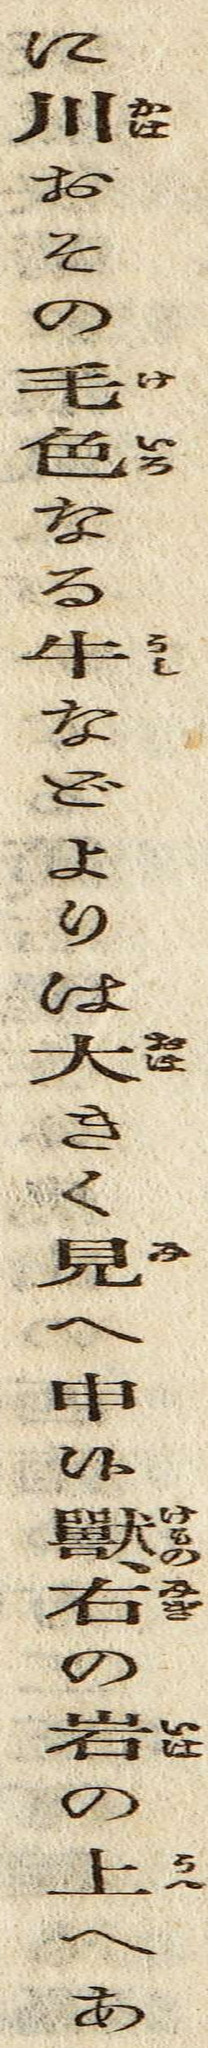に川おその毛色なる牛などよりは大きく見へ申候獣、右の岩の上へあ
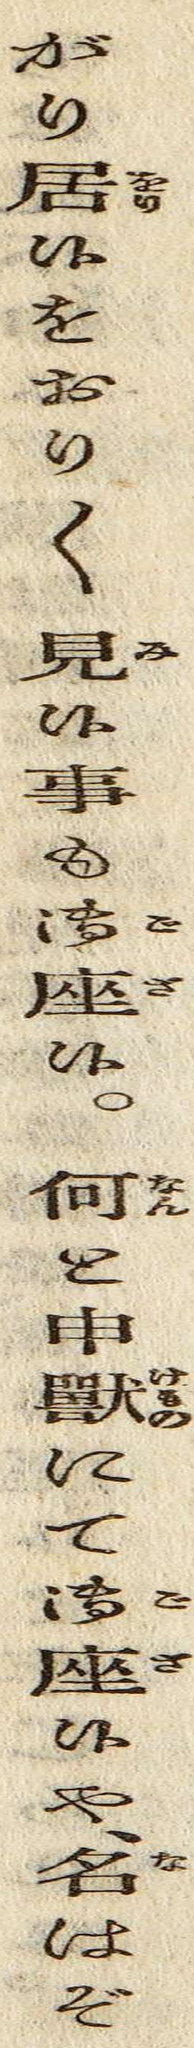がり居候をおり〳〵見候事も御座候。何と申獣にて御座候や、名はぞ
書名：日本漂流譚
